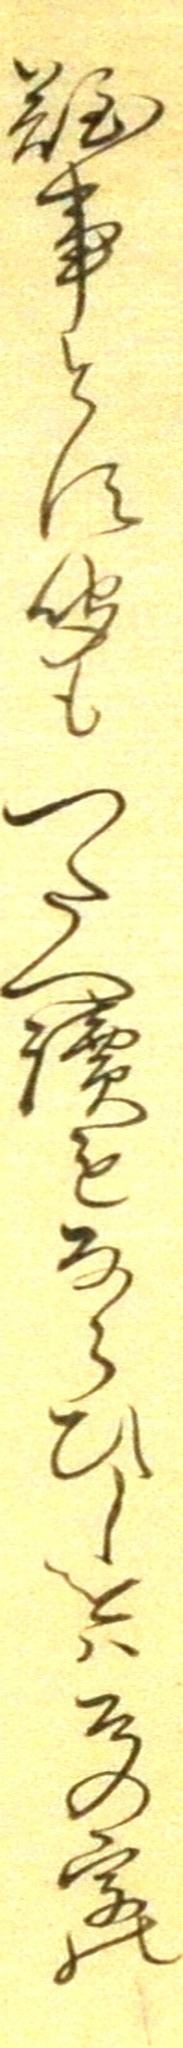難事とす聞もつたへ読もならひしとはその字の
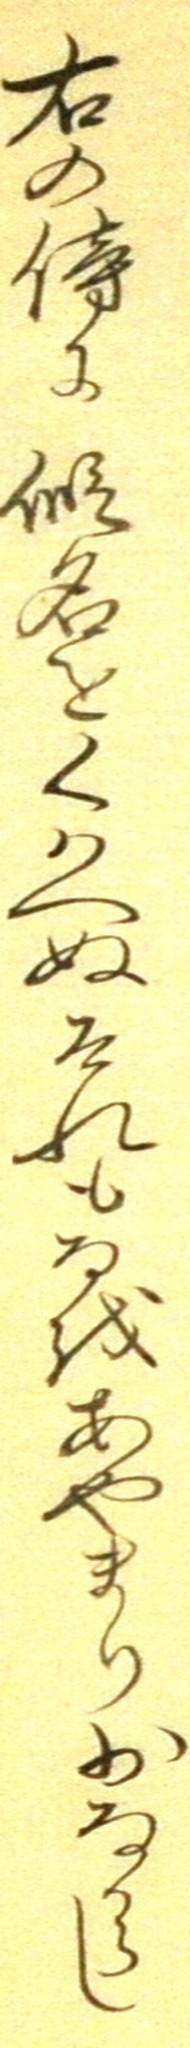右の傍らに仮名をくはへぬそれもなをあやまり少なからし
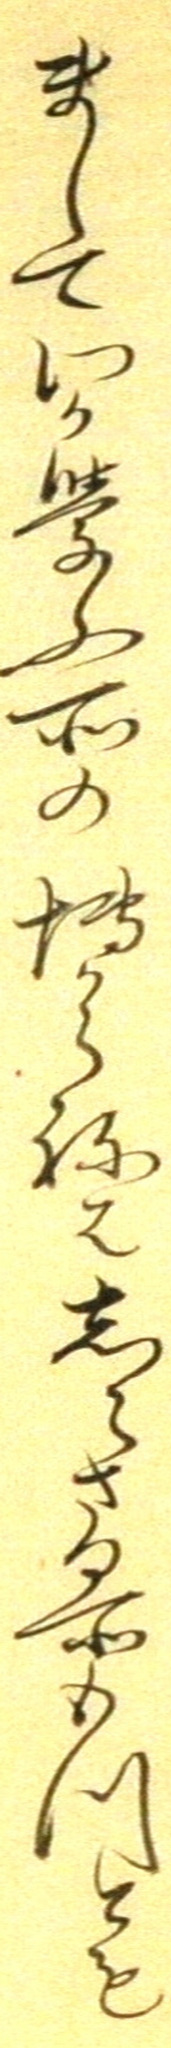ましてわか学ふ所の博からねはしらさる所もつとも
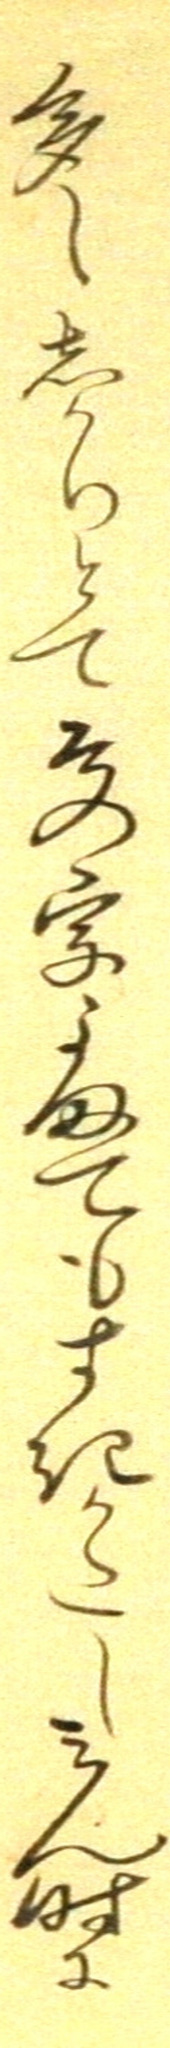多ししかりとてその字よまてもすきかたしみん時に
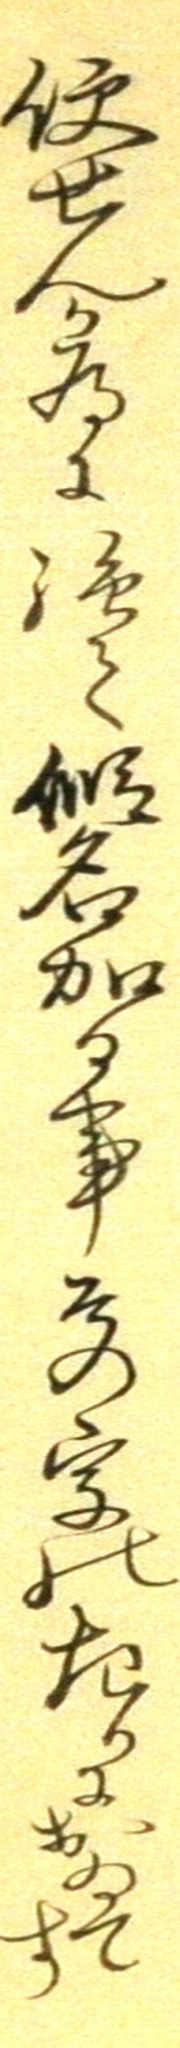便せんか為に強て仮名加る事その字の左りにおゐてす
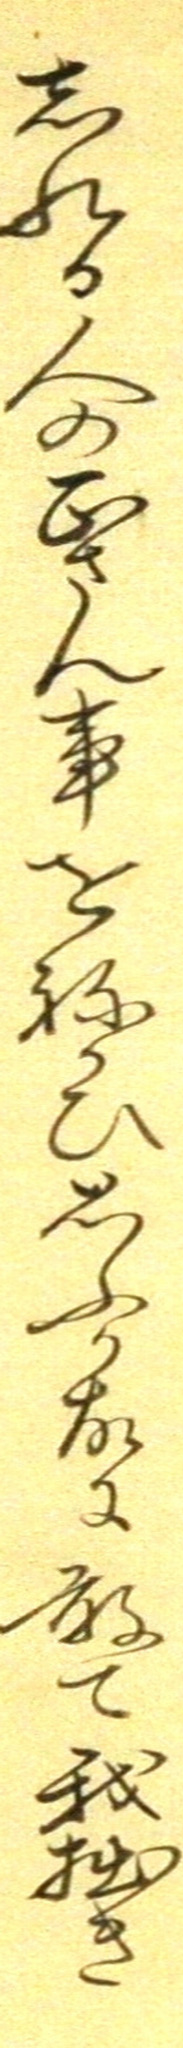しれる人の正さん事をねかひ思ふか故に敢て我拙き
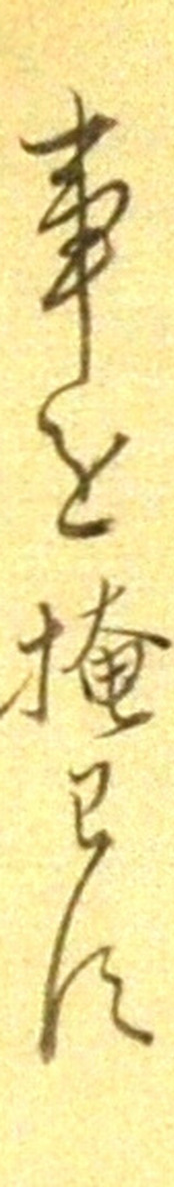事を掩わす

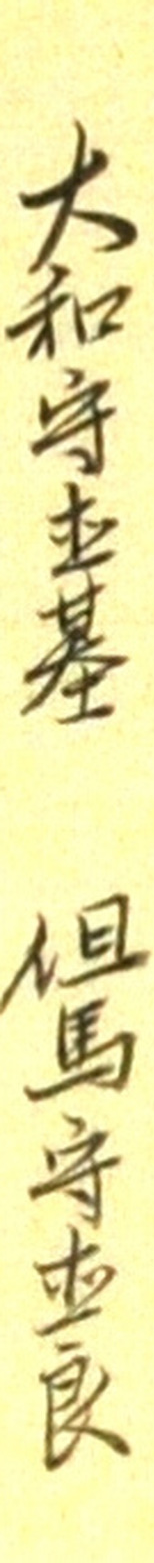大和守直基但馬守直良
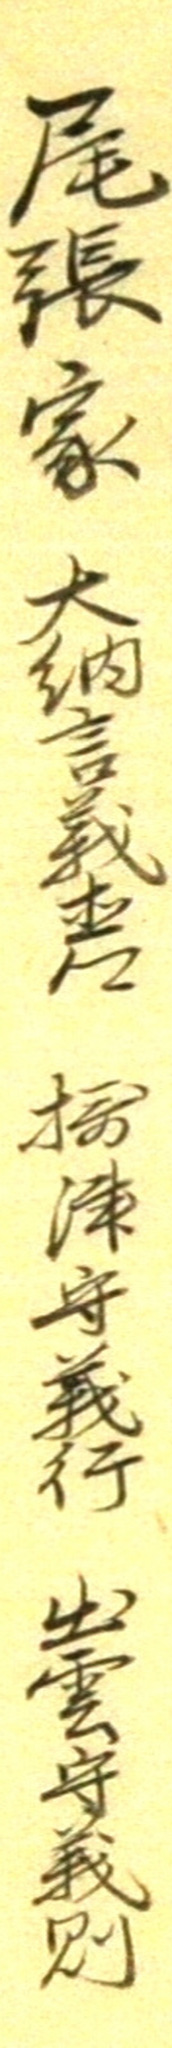尾張家大納言義直卿摂津守義行出雲守義則
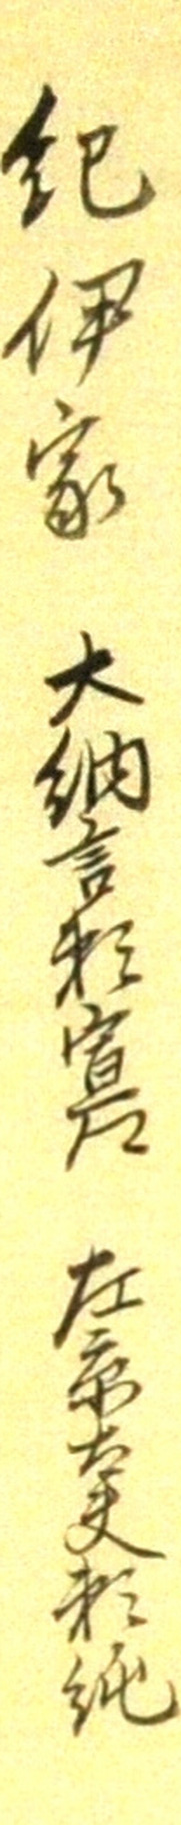紀伊家大納言頼宜卿左京太夫頼純
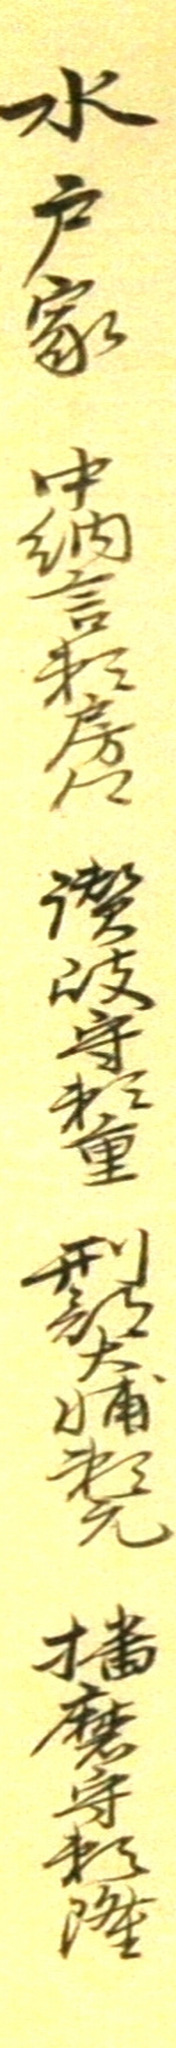水戸家中納言頼房卿讃岐守頼重刑部大輔頼元播磨守頼隆

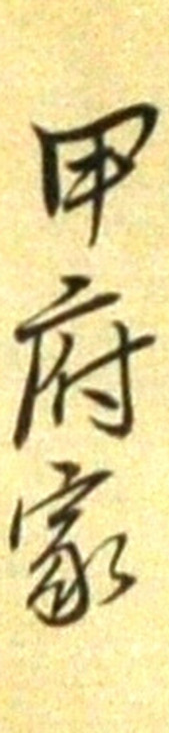甲府家
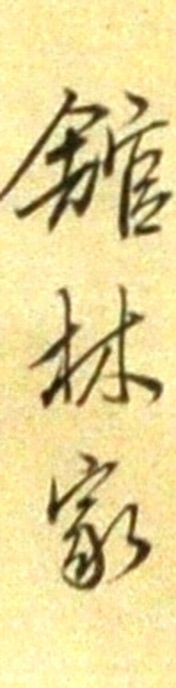館林家
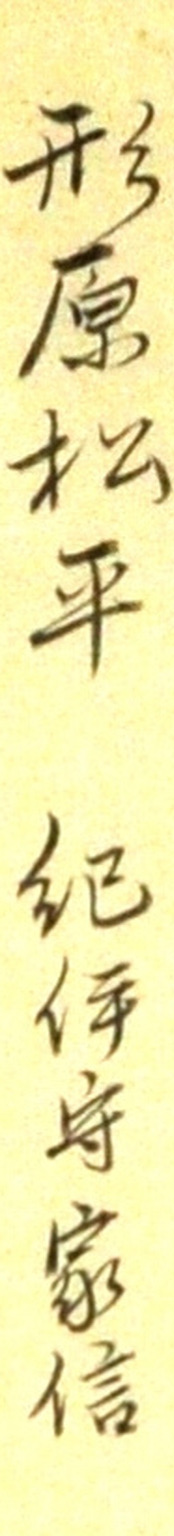形原松平紀伊守家信
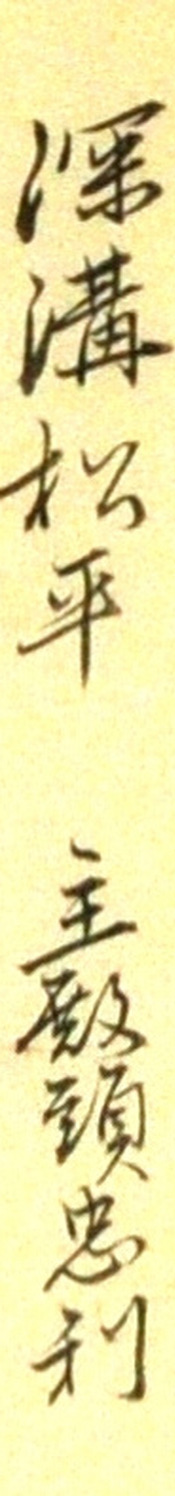深溝松平主殿頭忠利
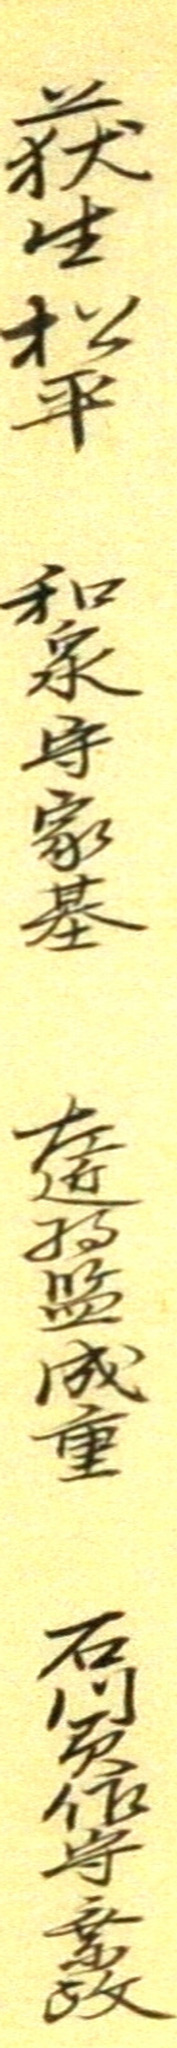荻生松平和泉守家基左近将監成重石川美作守乗政
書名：藩翰譜（一）
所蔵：伊那市立高遠町図書館・合同会社AMANE
